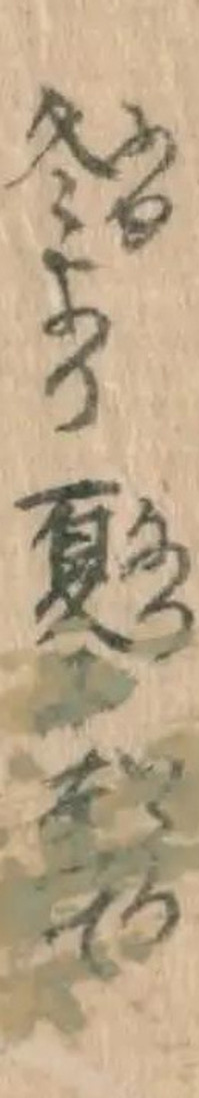冬より夏に至て
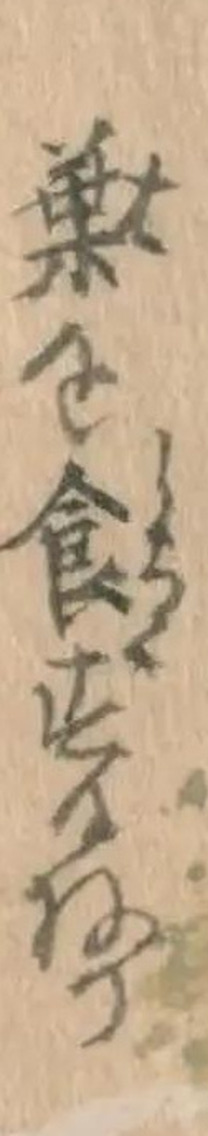葉を食するあり
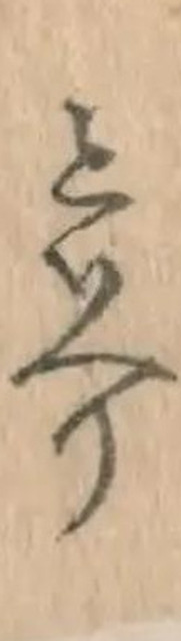といへり
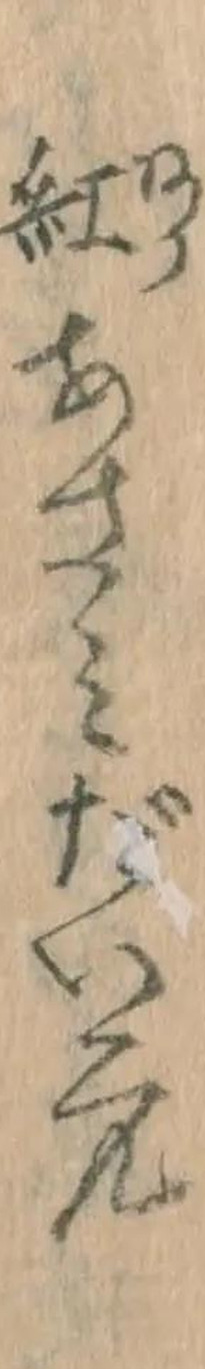紅あさみだいこん
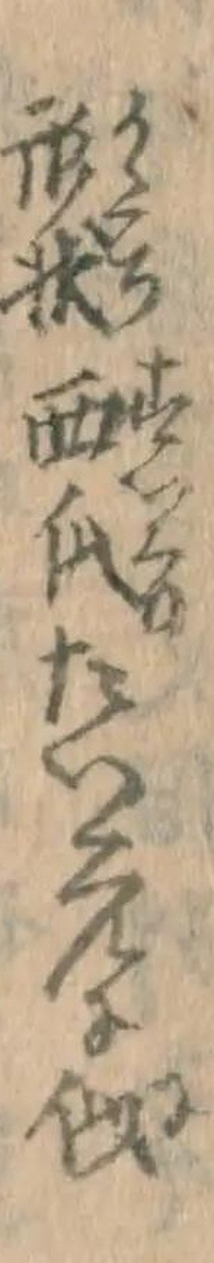形状西瓜たいこんに似
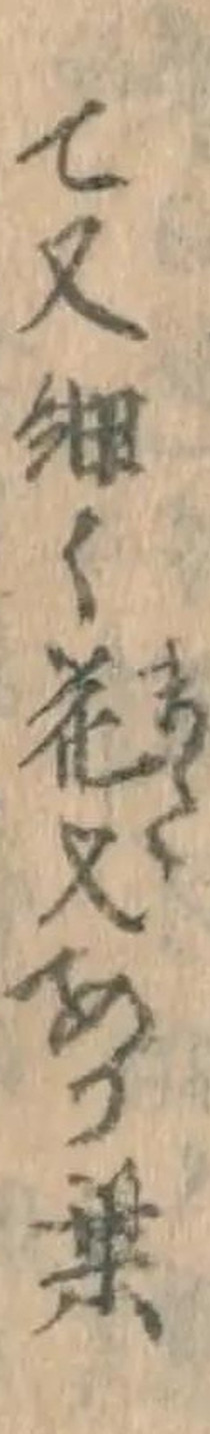て又細く花叉あり葉
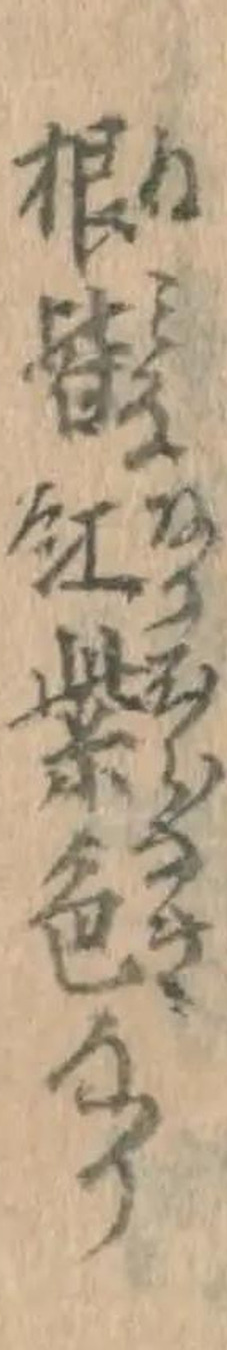根皆紅紫色なり

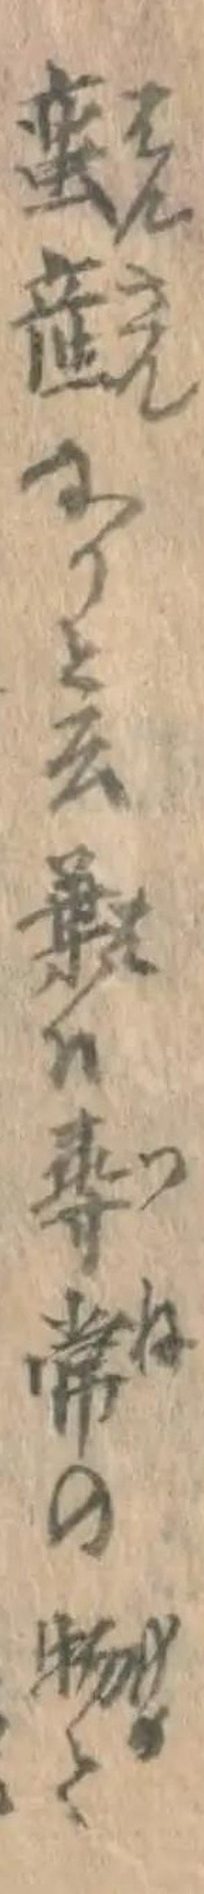蛮産なりと云葉は尋常の物と
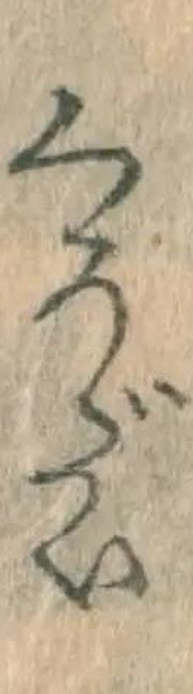くろだい
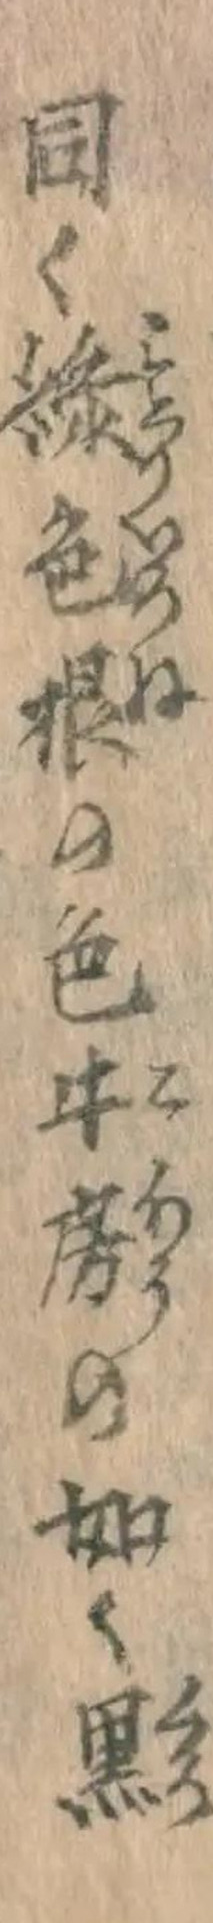同く緑色根の色牛房の如く黒
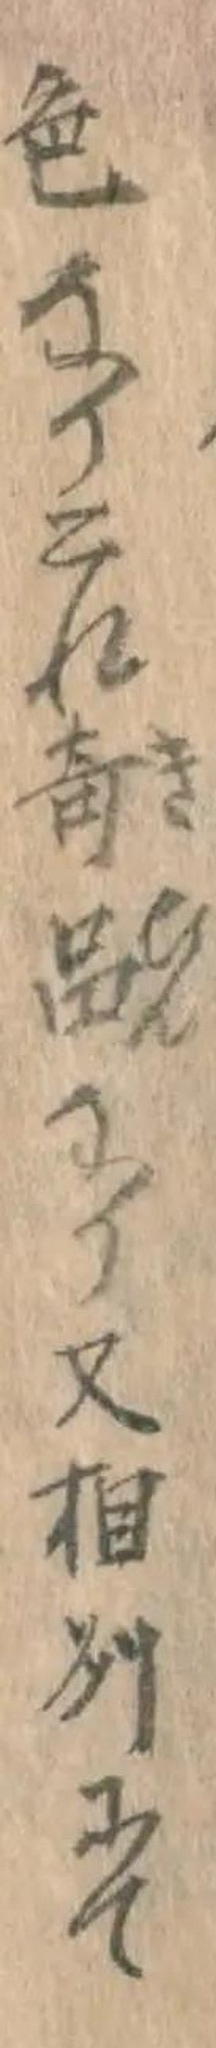色なりこれ奇品なり又相州にて
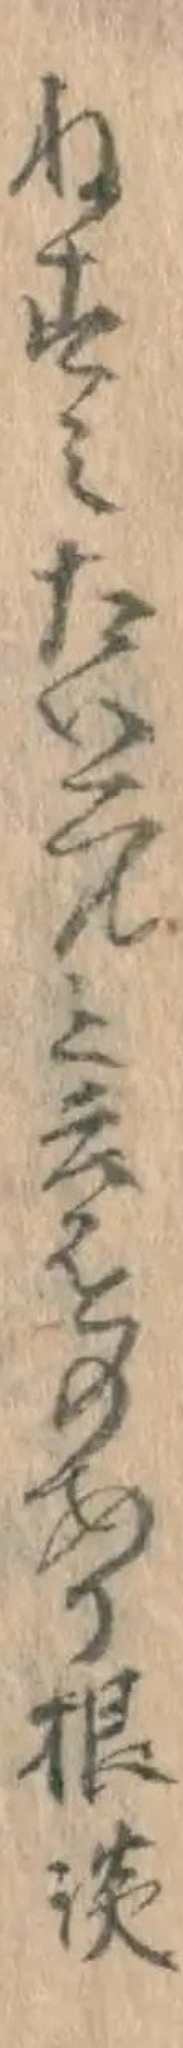ねすみたいこんと云ものあり根淡
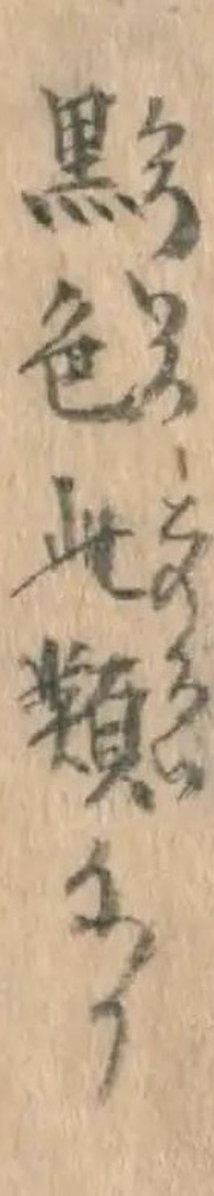黒色此類なり
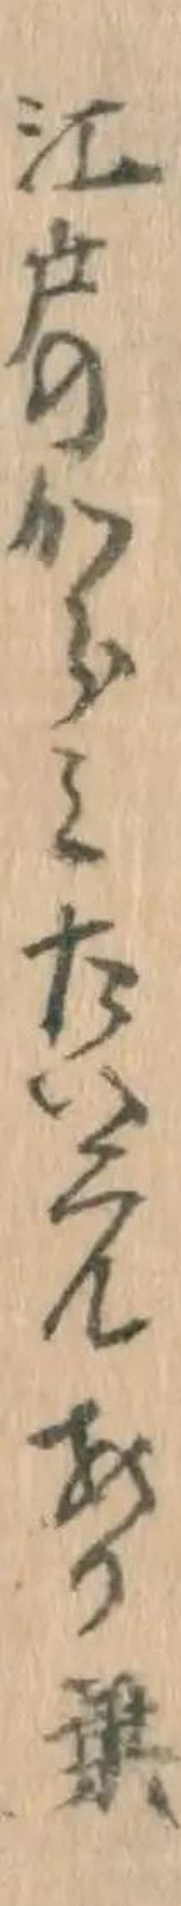江戸のからみたいこんあり葉
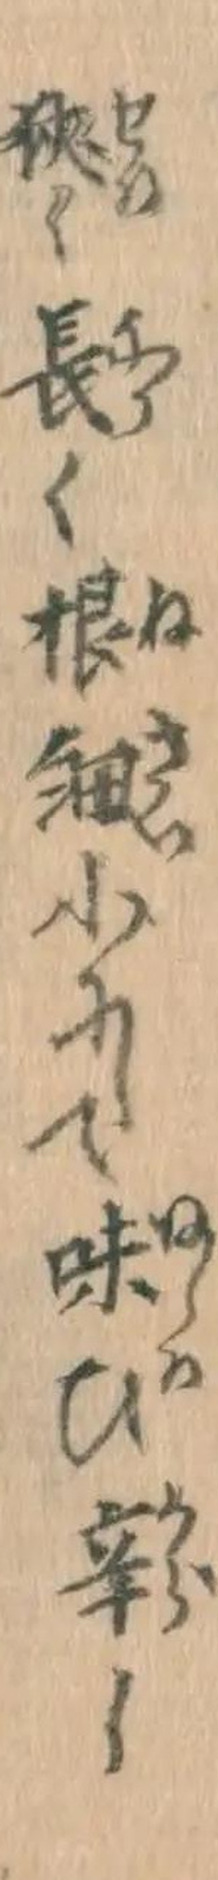狭く長く根細小にして味ひ辛し
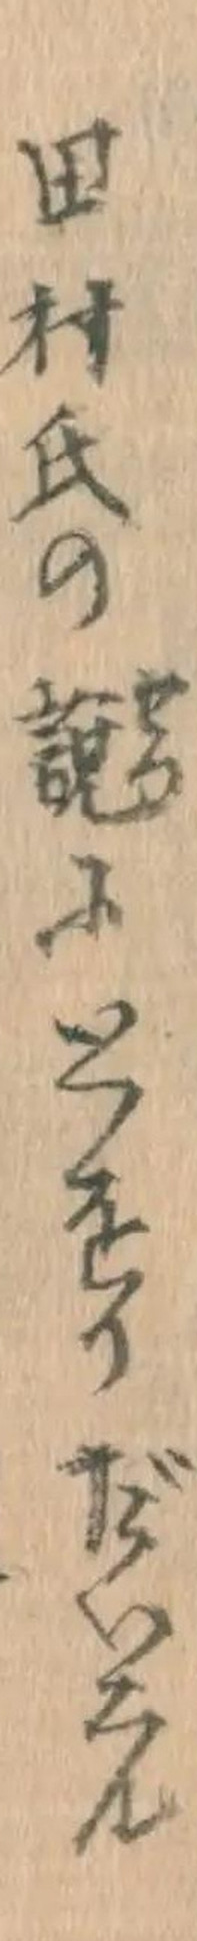田村氏の説にとをりだいこん
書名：本草図譜. 巻46-48
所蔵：国立国会図書館 National Diet Library, JAPAN
